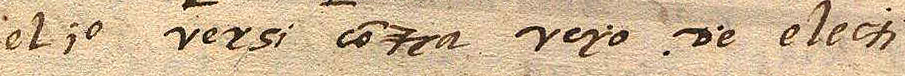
e l io versi cōtra vero De electi
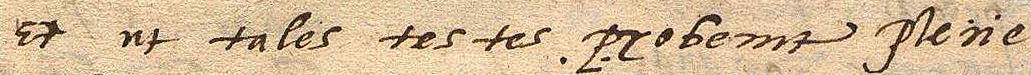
Et ut tales testes probemt plene
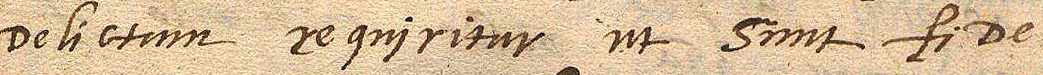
Delictum requjritur ut sunt fiDe
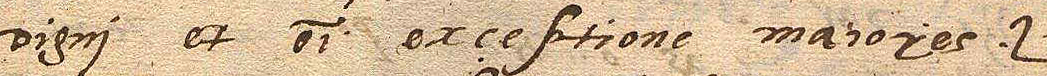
Dignj et ōi exceptione maiores .L.
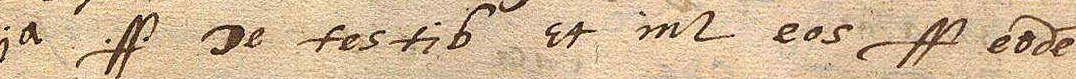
ia .ff. De testib Et in L eos ff eodē
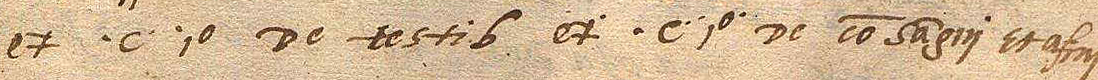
et .c. io De testib et .c. io De cōsāgnj Et afinj
